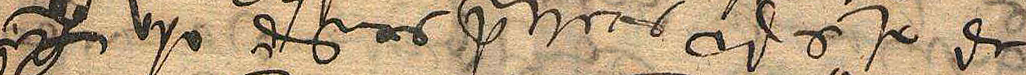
segdo vyo ē suas p̄tjcas e deseJo de
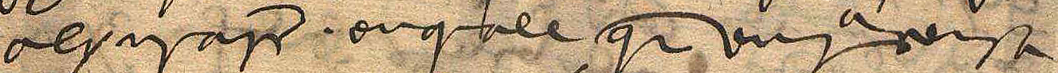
alyujarē. ou quallq̄r outa cousa
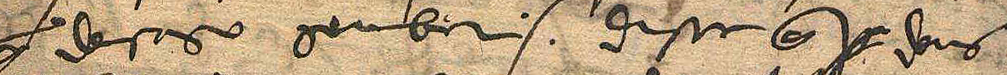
q̄ do aso souber ./. disse q̄ p dous
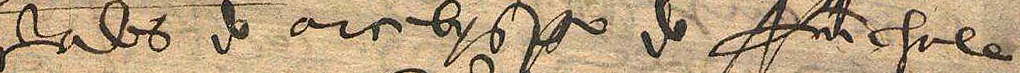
c̄iados do arcebyspo do ffūchall
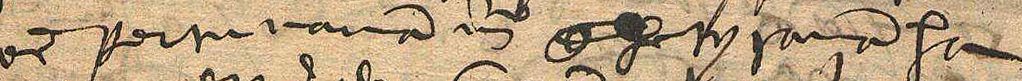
o ēportunauā mto q̄ lhe tyrauā ha
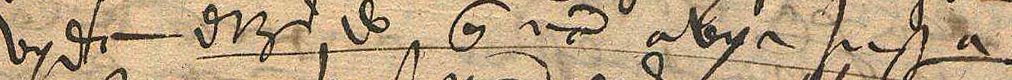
vyda dizēdo q̄ nā avya Justa
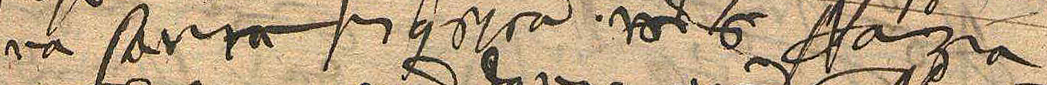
na santa Jnqisyçā. nē se ffazia
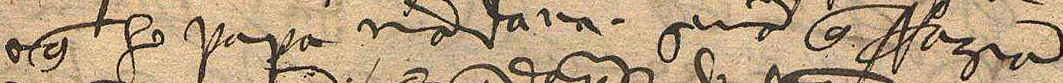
o q̄ ho papa mādaua. senā q̄ ffaziā
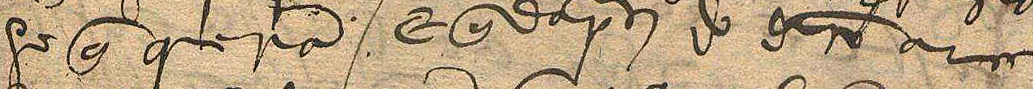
ho q̄ queriā ./. E q̄ da p̄te do dito arce
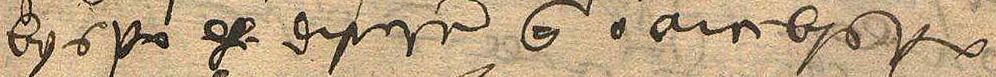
byspo lhe diserā q̄ o arcebjspo
